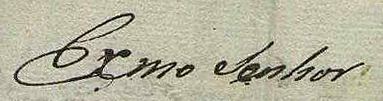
Exmo Senhor
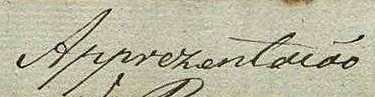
Apprezentaçaõ
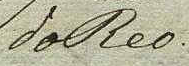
do Reo.
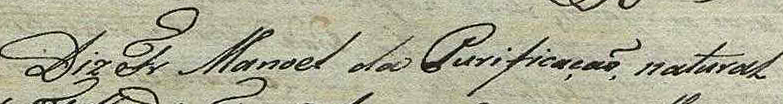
Diz Fr Manoel da Purificaçaõ, natural
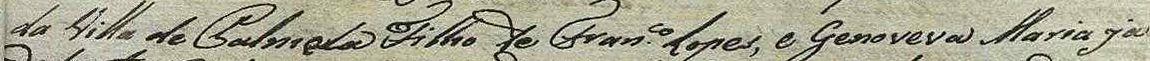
da Villa de Palmela Filho de Fran.co Lopes, e Genoveva Maria ja
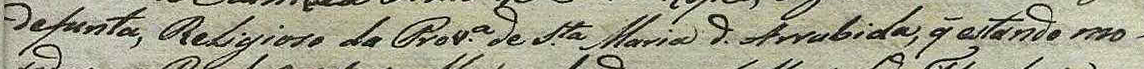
defunta, Religioso da Prov.a de S.ta Maria d. Arrabida, q̄ estando mo
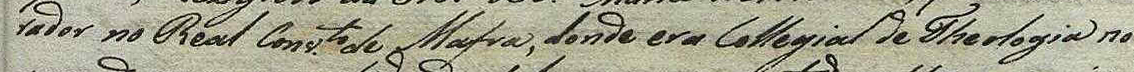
rador no Real Conv.to de Mafra, donde era Collegial de Theologia no
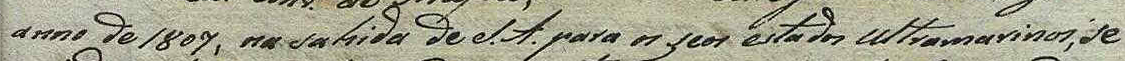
anno de 1807, na sahida de S.A. para os seos estados ultramarinos, se
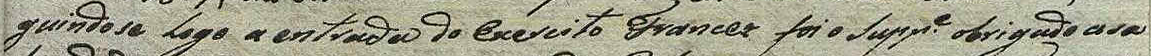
guindose Logo a entrada do Exercito Francez foi o Supp.e obrigado a sa
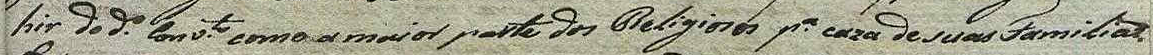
hir do d.o conv.to como a maior parte dos Religiosos p.a caza de suas Familias,
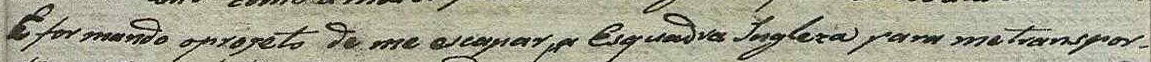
E formando o projeto de me escapar p.a Esquadra Ingleza para me transpor
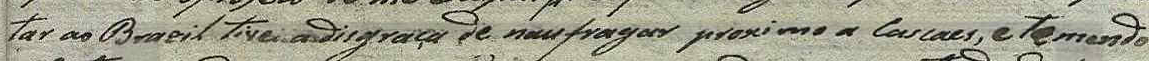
tar ao Brazil tive a disgraça de naufragar proximo a Cascaes, e temendo
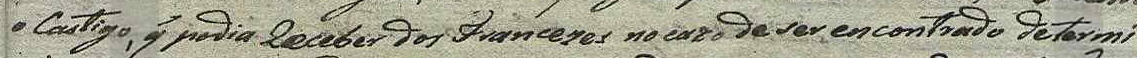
o Castigo, q̄ podia Receber dos Francezes no cazo de ser encontrado determi
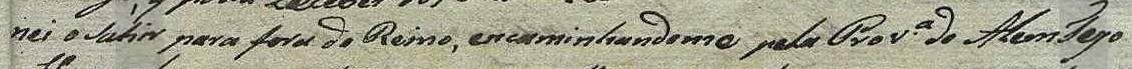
nei o sahir para fora do Reino, encaminhandome pela Prov.a do AlemTejo
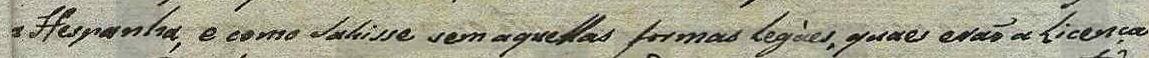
a Hespanha, e como sahisse sem aquellas formas legàes, quaes eraõ a Licença
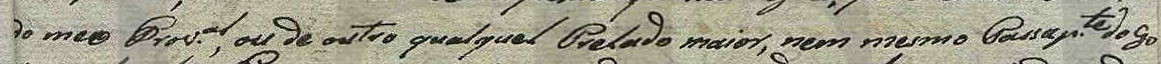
do meo Prov.al, ou de outro qualquel Prelado maior, nem mesmo Passap.te do Go
